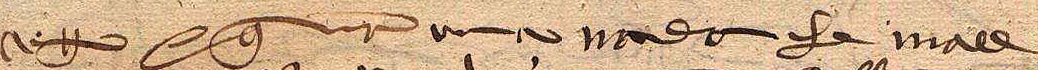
çego e q̄ nā ouço nada he mall
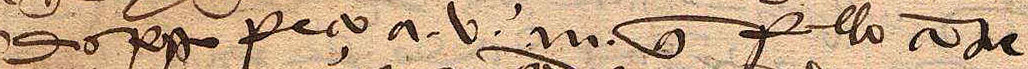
desposto peço a .v. .m. q̄ pello c̄ote
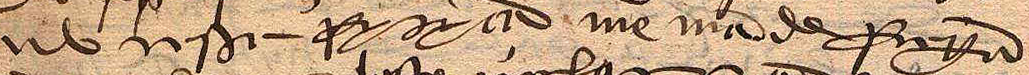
udo nesta pytyçā me māde pregū
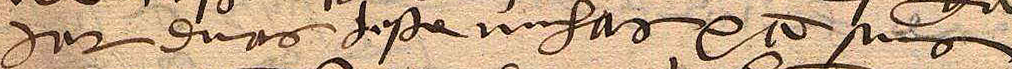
tar duas testemunhas e c̄o seus
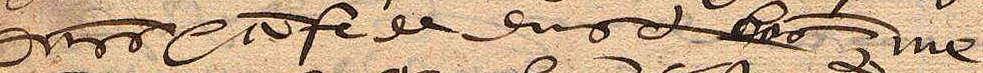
ditos e c̄o fe de dous tbas̄ me
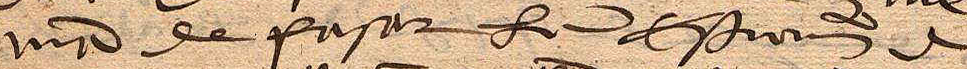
māde padar hū Estromto de
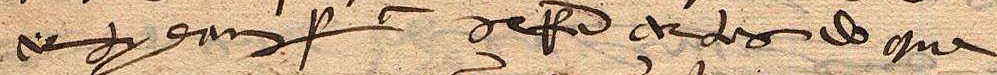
çertydam ꝑa seRē çertos do que
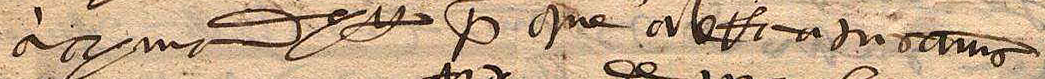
acyma dygo p̄o que aveRa tres an̄os
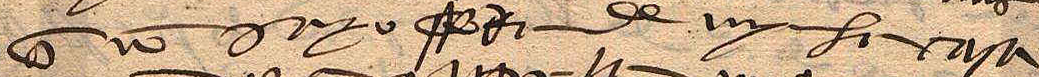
q̄ nō sayo ffoRa de mynha casa
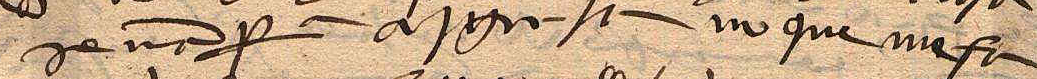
senā ꝑa a jgreja no que me fa
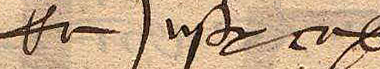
Ra Justyca
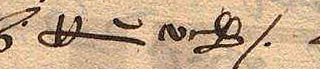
go coelho /.
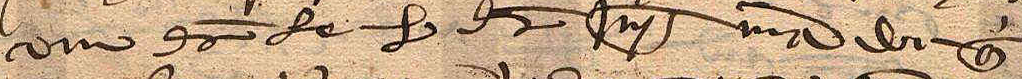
como dt̄o he ho dt̄o Jujz mādou q̄
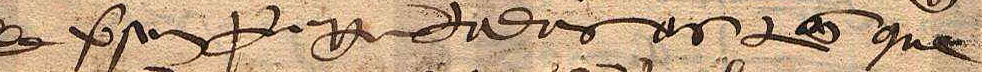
lhe fosem pergūtadas as tas que
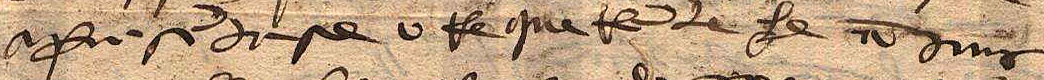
apresētase o RequeRēte he c̄o seus
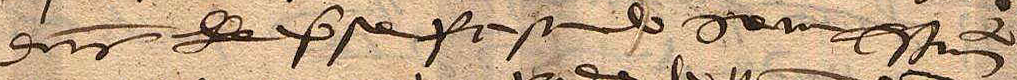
dt̄os lhe fose pasado seu Estrmto
